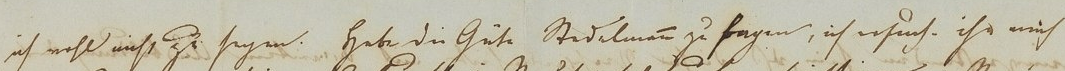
ich wohl nicht zu sagen. Habe die Güte Stadelmann zu sagen, ich ersuche ihn mich
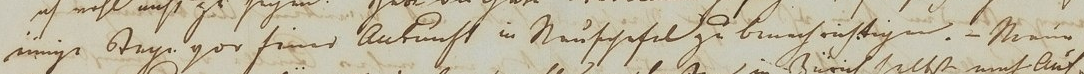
einige Tage vor seiner Ankunft in Neuschatel zu benachrichtigen. – Meine
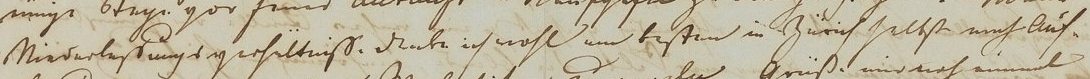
Niederlaßungsverhältniße denke ich wohl am besten in Zürich selbst nach Auf-
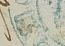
Dein
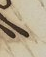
Sinz.
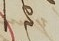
8.3.
